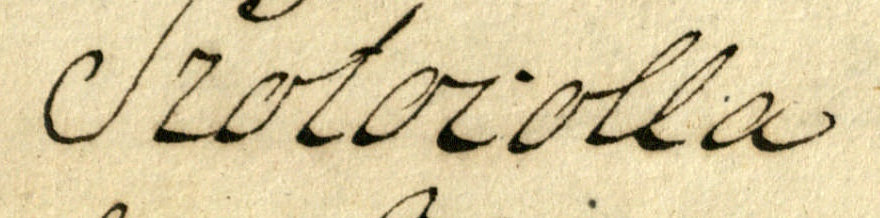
Protocolla
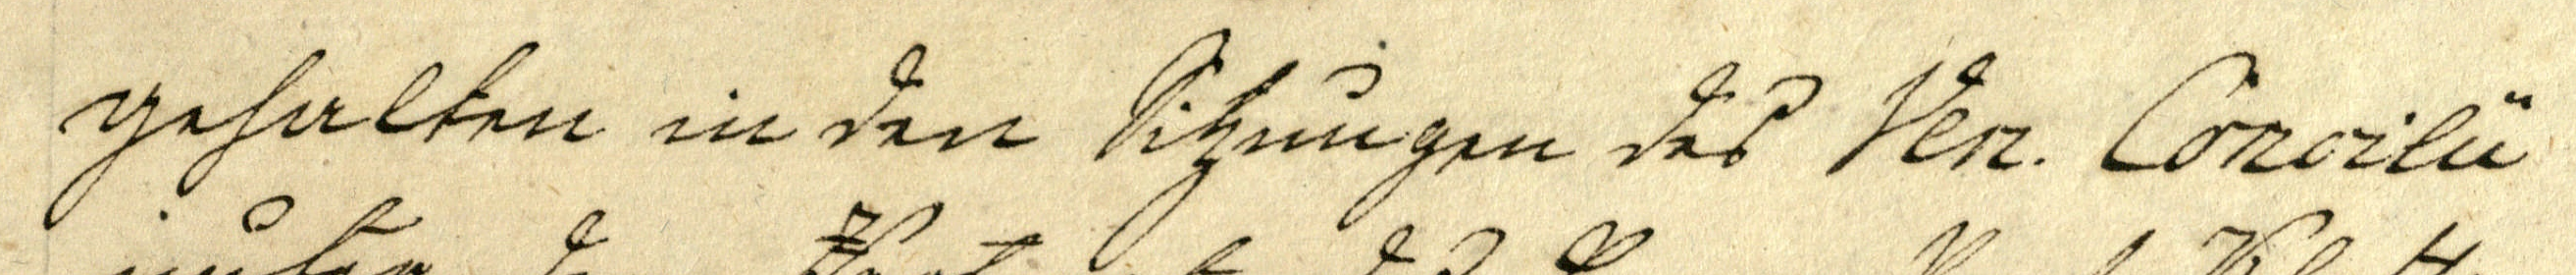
gehalten in den Sitzungen des Ven. Concilii
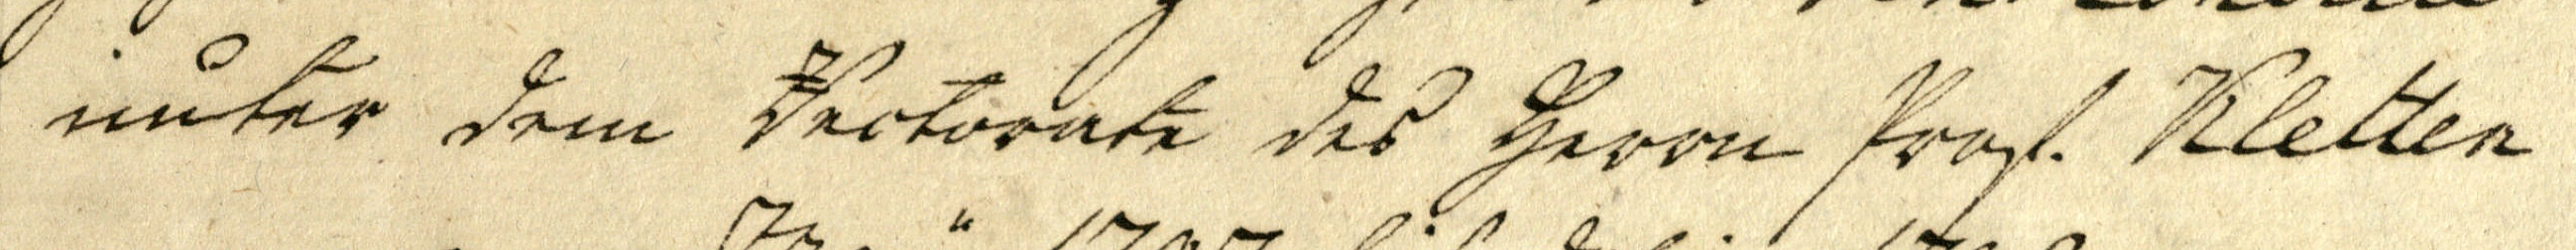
unter dem Rectorate des Herrn Prof. Kletten
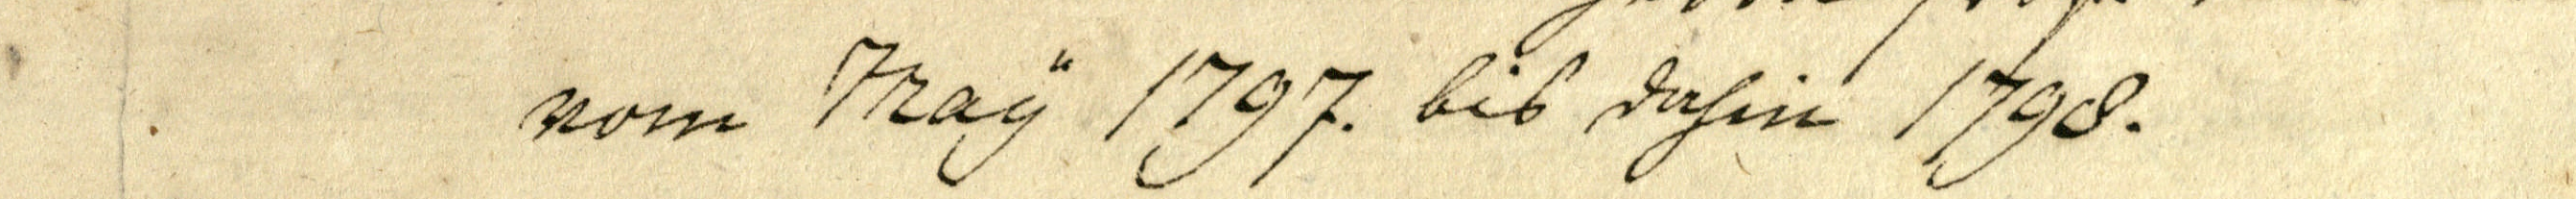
vom Maÿ 1797. bis dahin 1798.
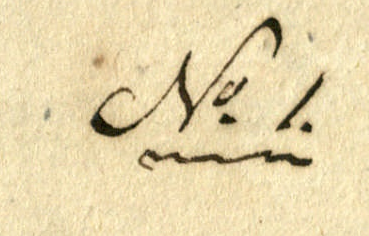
Nº1.
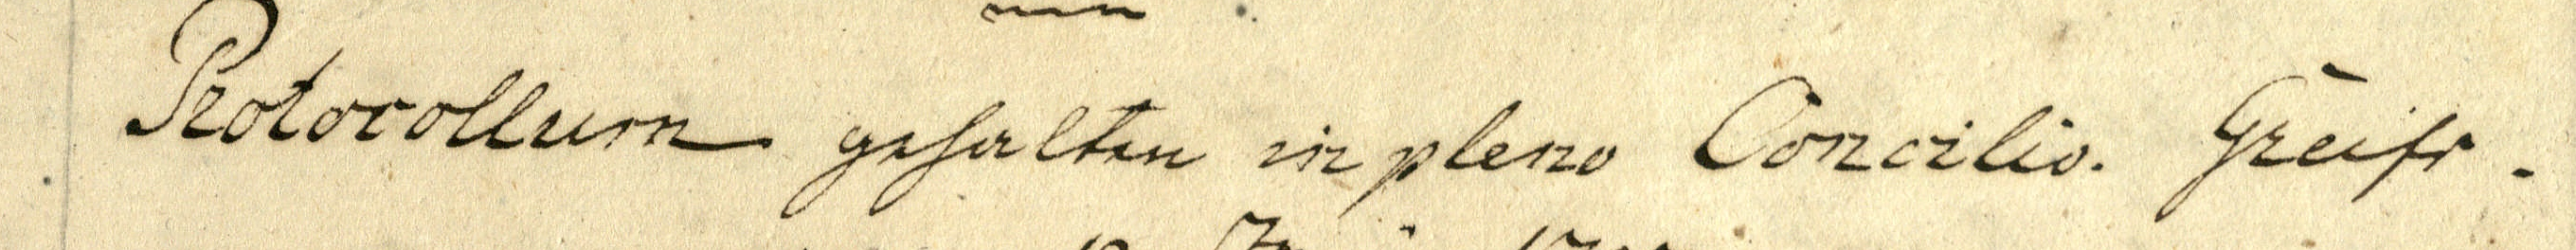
Protocollum gehalten in pleno Concilio Greifs¬
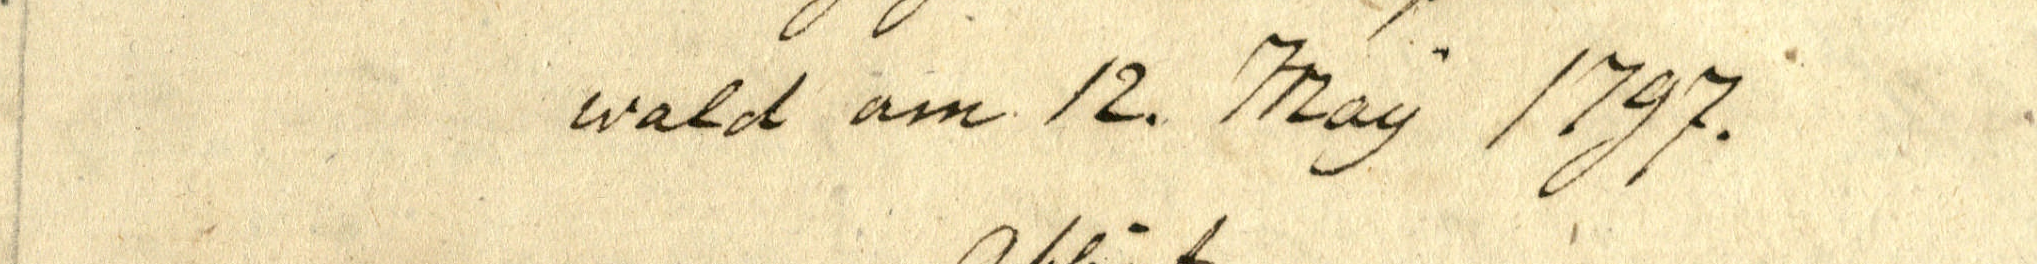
wald am 12. Maÿ 1797.
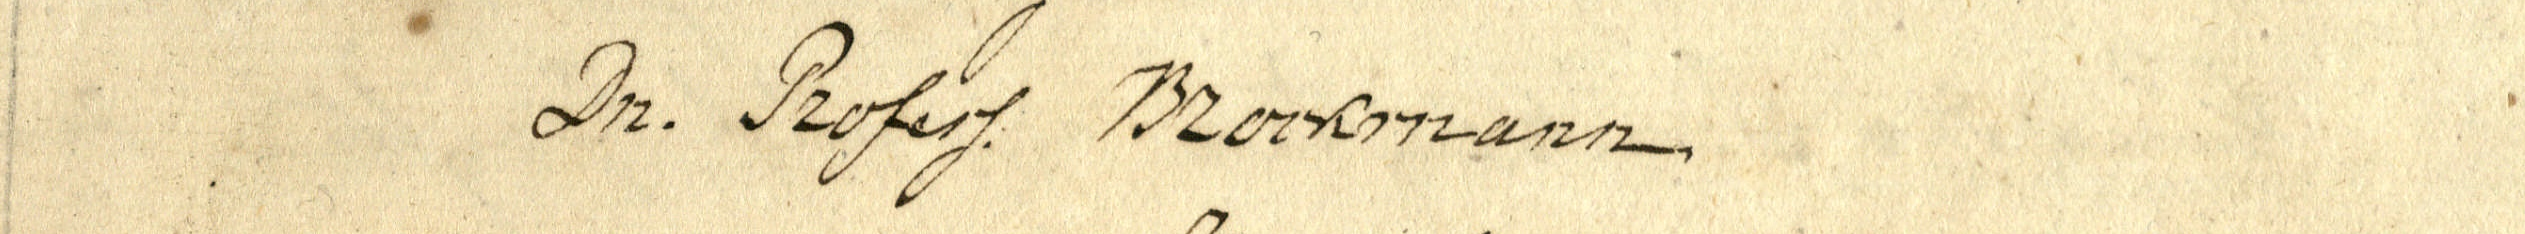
Dn. Profess. Brockmann
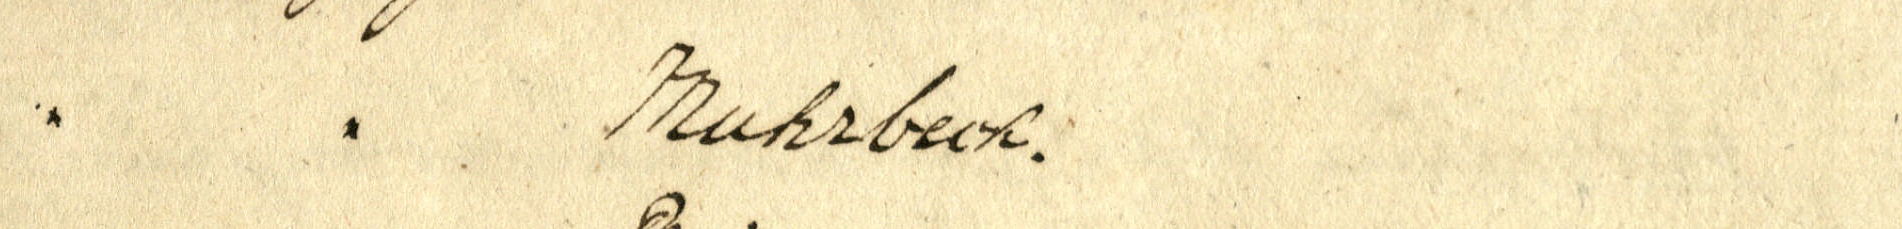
Muhrbeck.
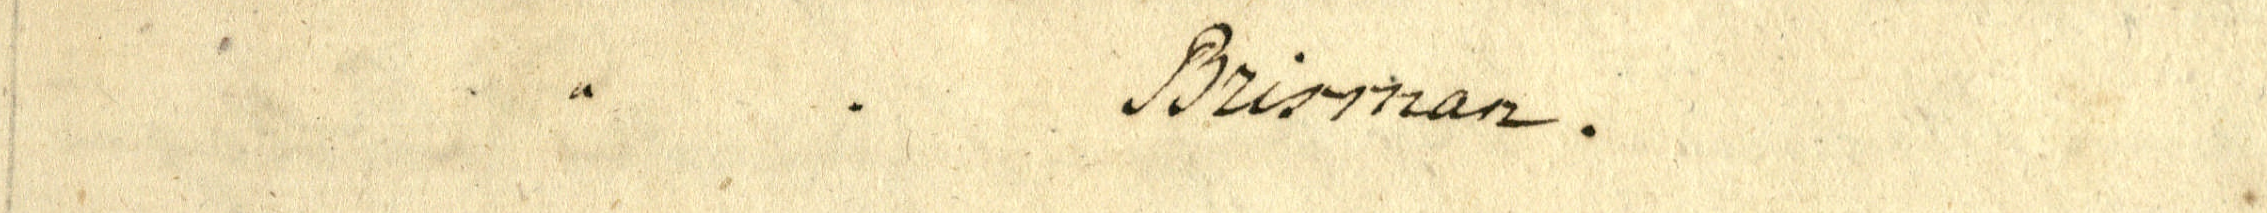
Brisman.
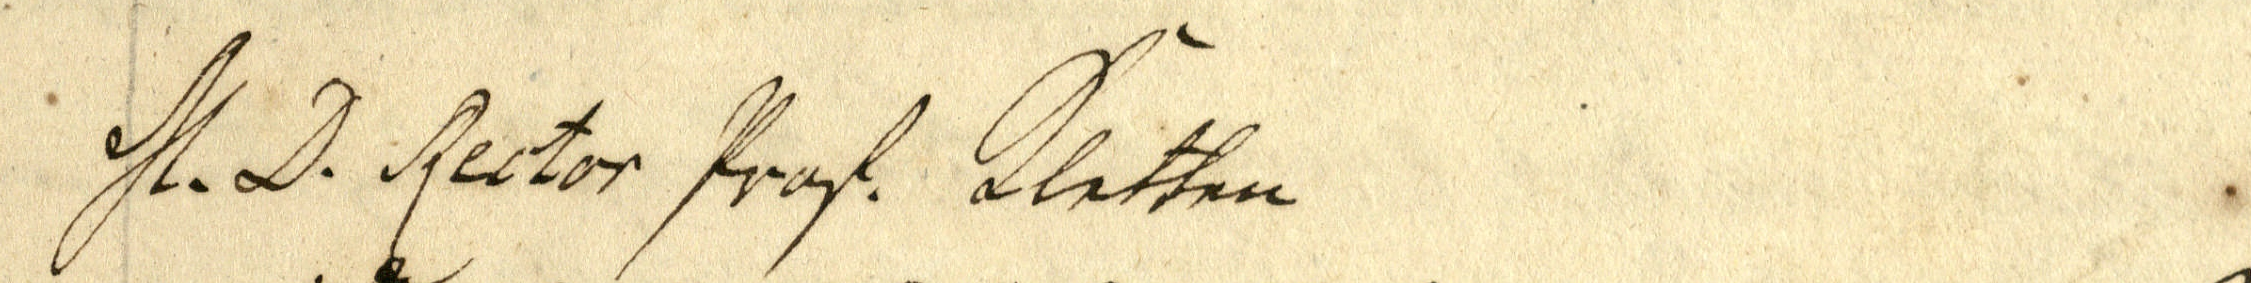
M. D. Rector Prof. Kletten
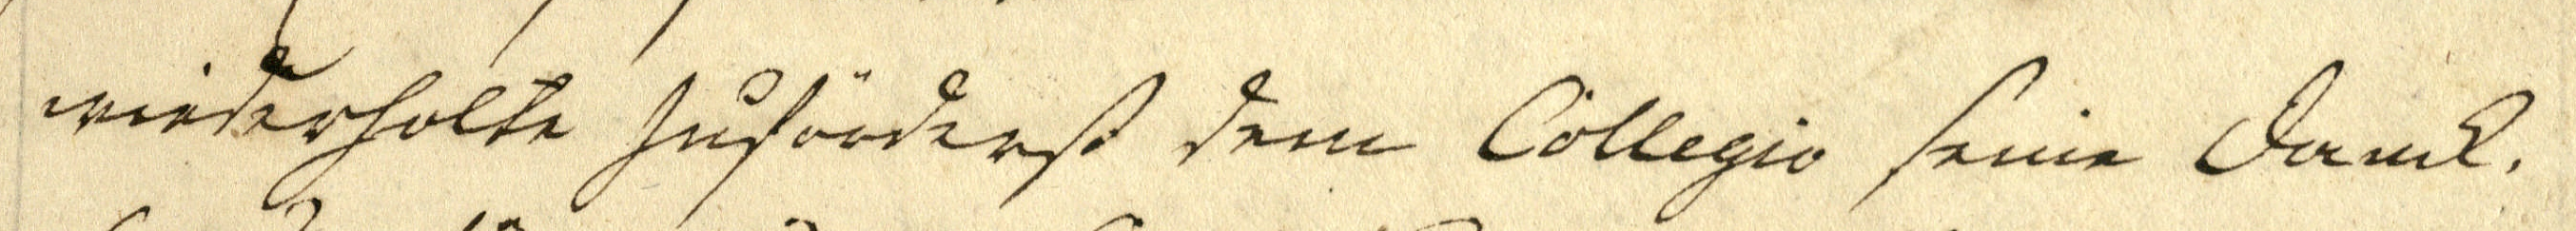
wiederholte zuförderst dem Collegio seine Danck¬
